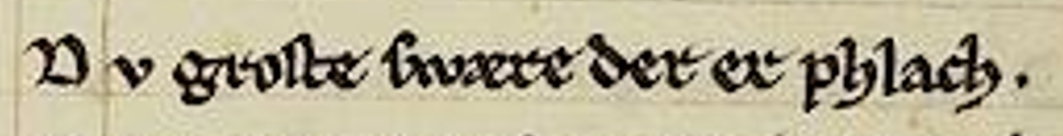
Dv groſte ſw[ae]re der er phlach.
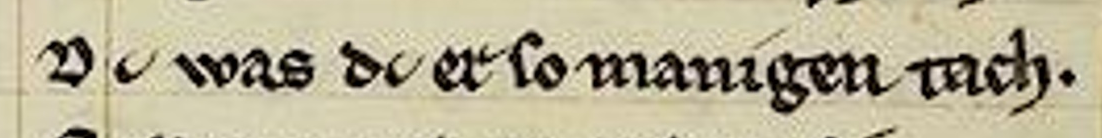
D(az) was d(az) er ſo manigen tach.
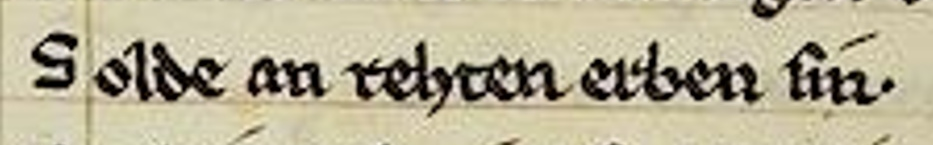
Solde an rehten erben ſin.
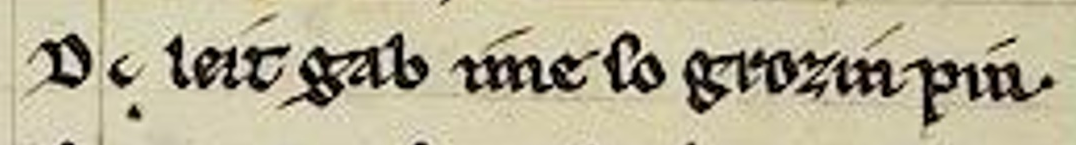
D(az) leit gab ime ſo grozin pin.
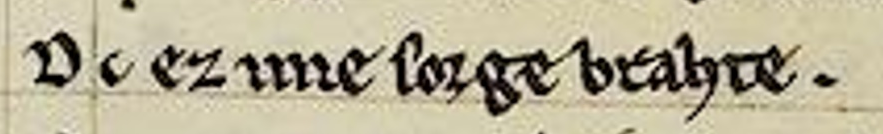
D(az) ez ime ſorge brahte.
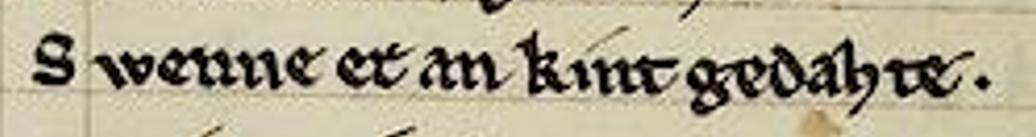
Swenne er an kint gedahte.
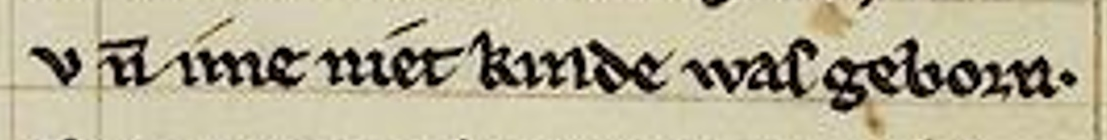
Vn(d) ime niet kinde waſ geborn.
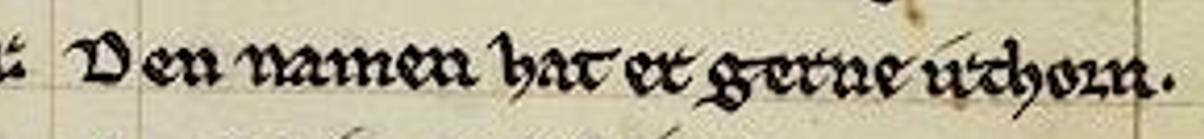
Den namen hat er gern irchorn.
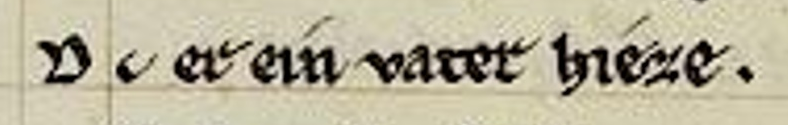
D(az) er ein vater hieze.
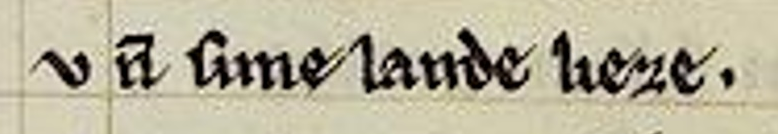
Vn(d) ſime lande lieze.
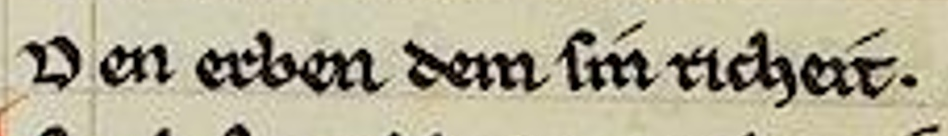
Den erben dem ſin richeit.
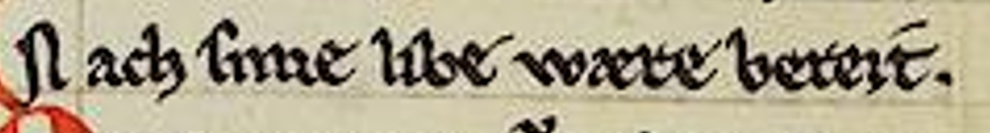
Nach ſime libe w[ae]re bereit.
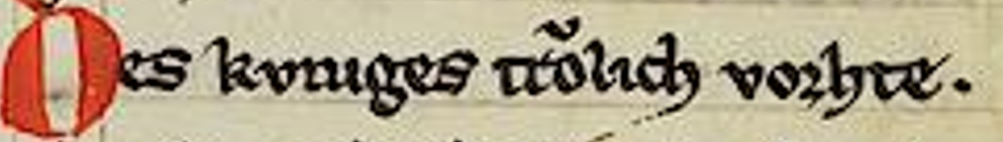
*Des kvniges tro°vlich vorhte.
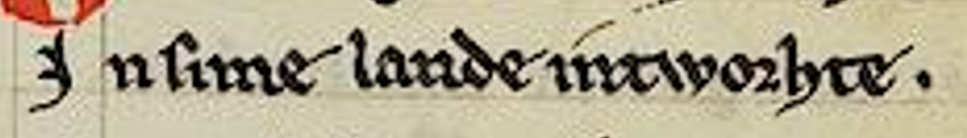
In ſime lande intworhte.
